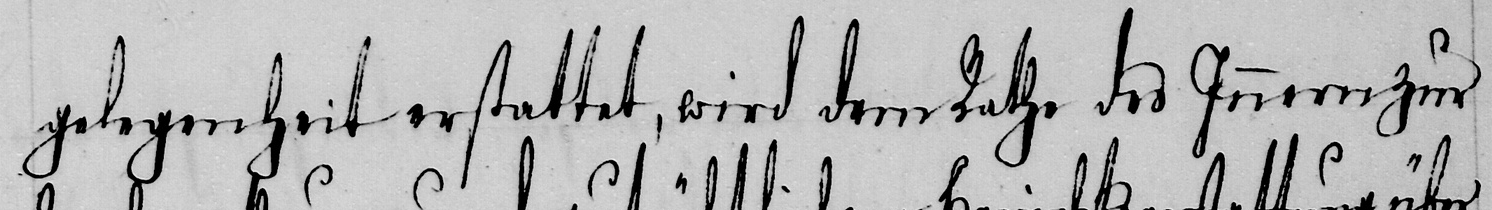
gelegenheit erstattet, wird dem Rathe des Innern zur
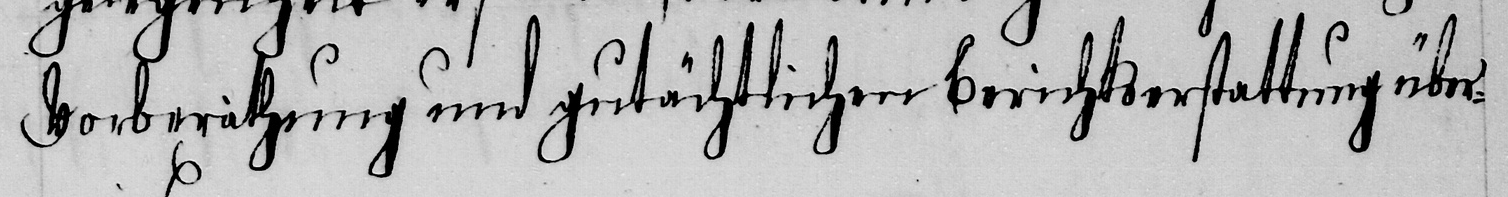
Vorberathung und gutächtlichen Berichtserstattung über¬
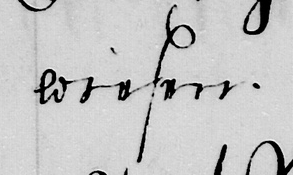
wiesen.
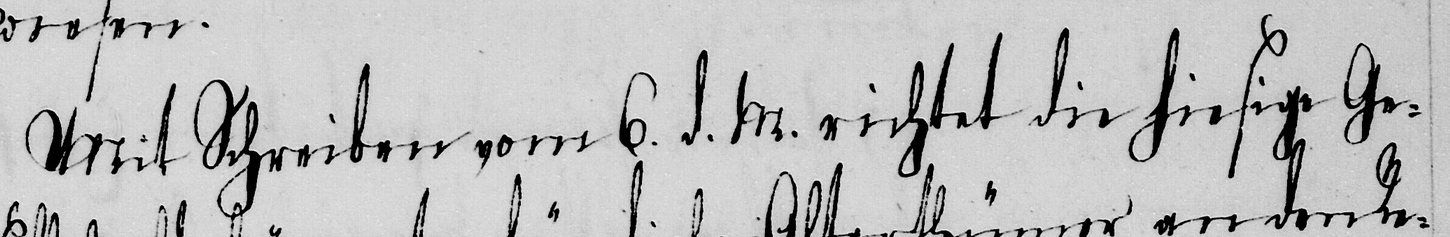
Mit Schreiben vom 6. d. M. richtet die hiesige Ges¬
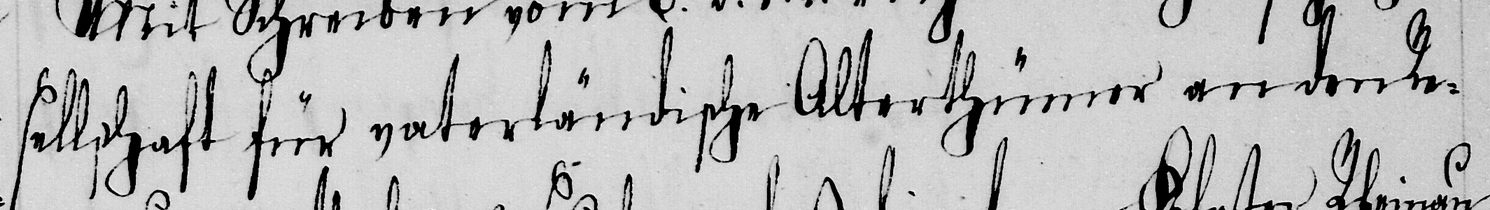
ellschaft für vaterländische Alterthümer an den Re¬
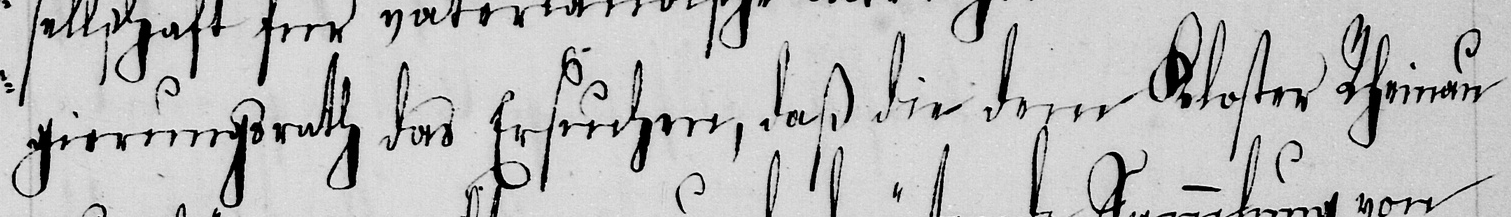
gierungsrath das Ersuchen, daß die dem Kloster Rheinau
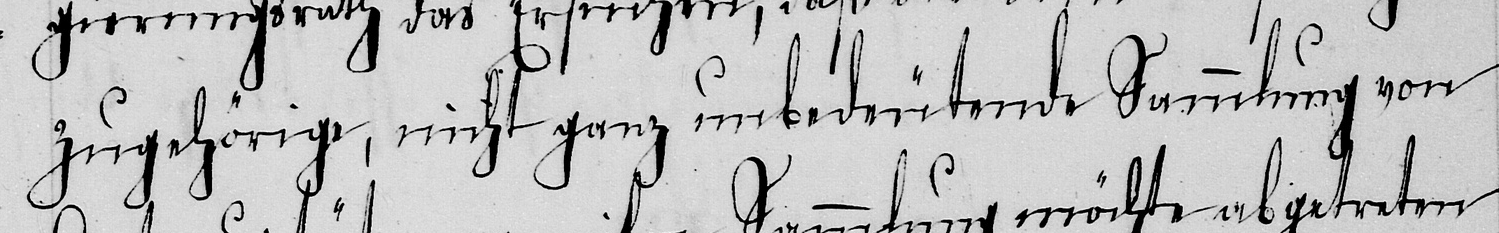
zugehörige, nicht ganz unbedeutende Sammlung von
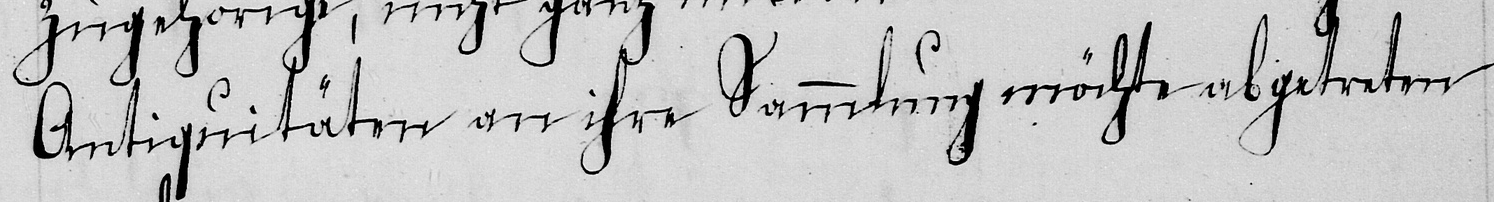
Antiquitäten an ihre Sammlung möchte abgetreten
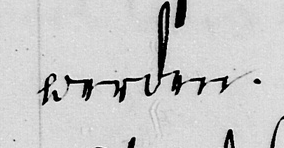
werden.
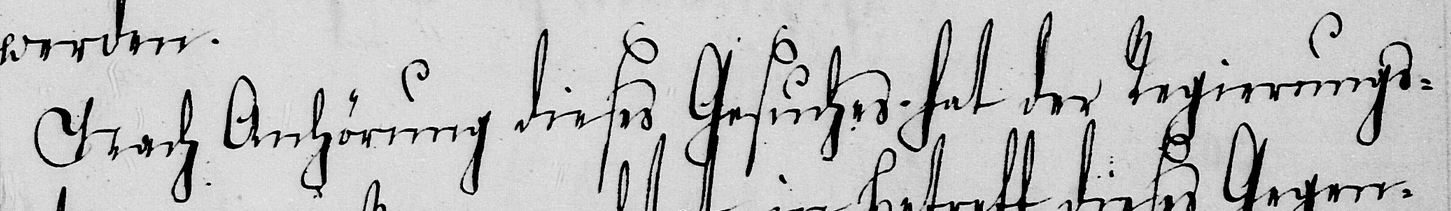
Nach Anhörung dieses Gesuches hat der Regierungs¬
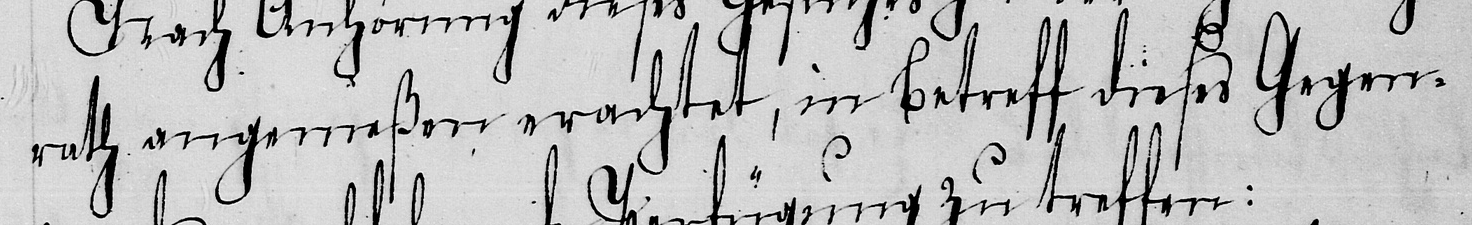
rath angemeßen erachtet, in Betreff dieses Gegen¬
